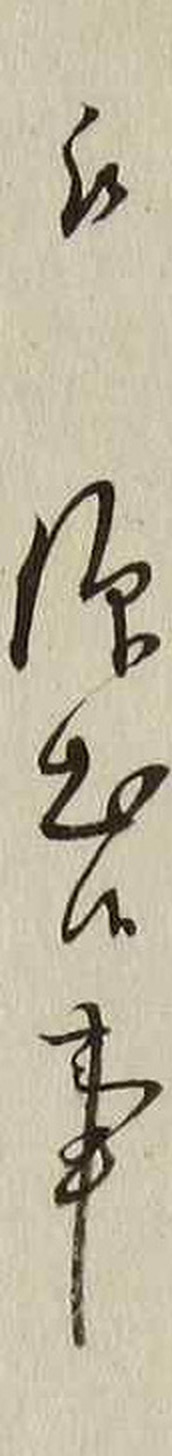被仰出候事
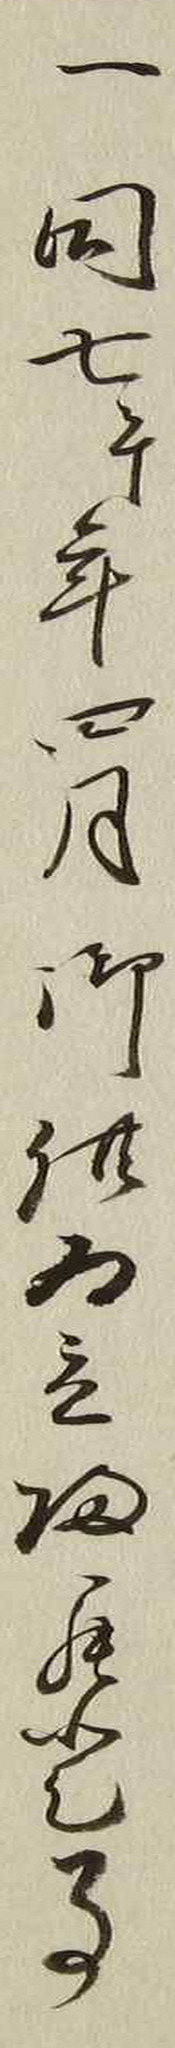一同七午年四月御供為立帰罷登事
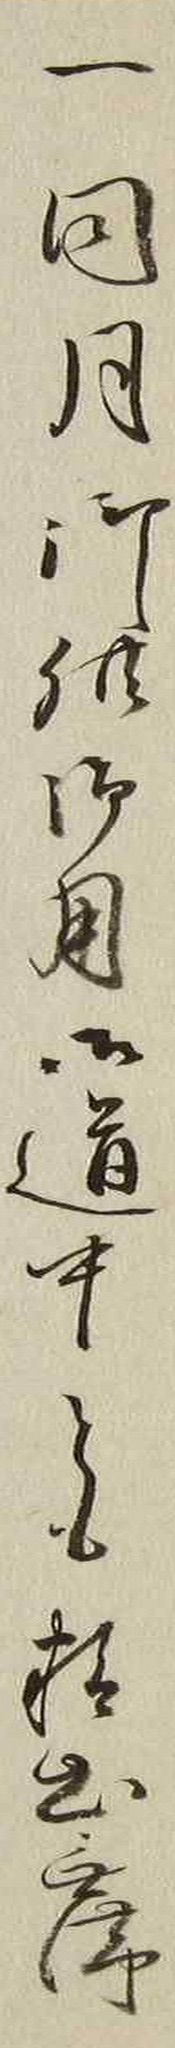一同月御供御用御道中ニも精出無滞
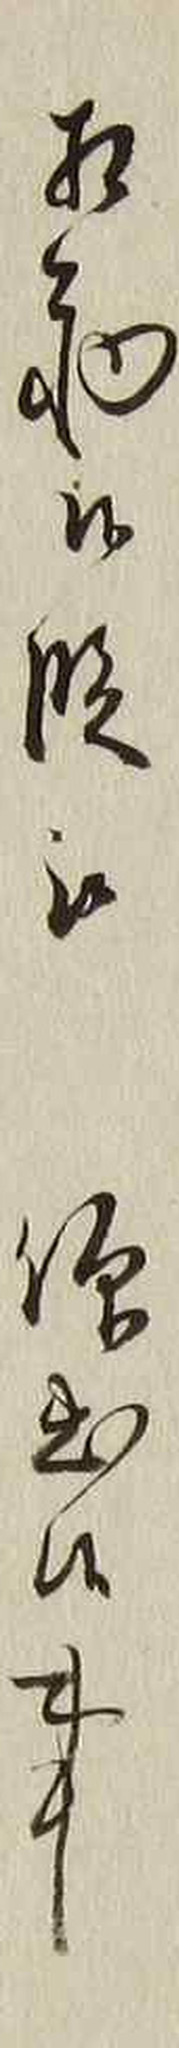相勤候段被仰出候事
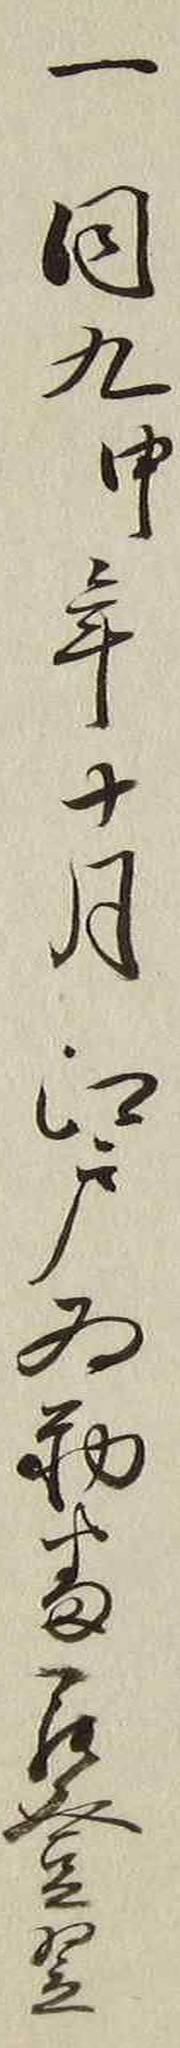一同九申年十月江戸為勤番罷登翌
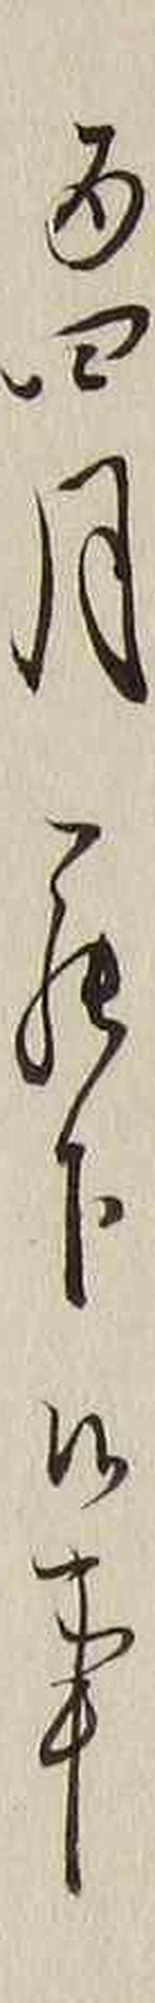酉四月罷下候事
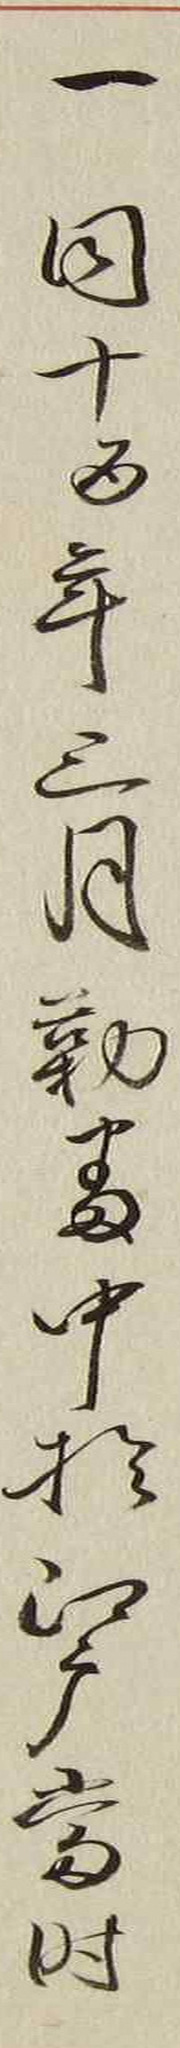一同十酉年三月勤番中於江戸当時
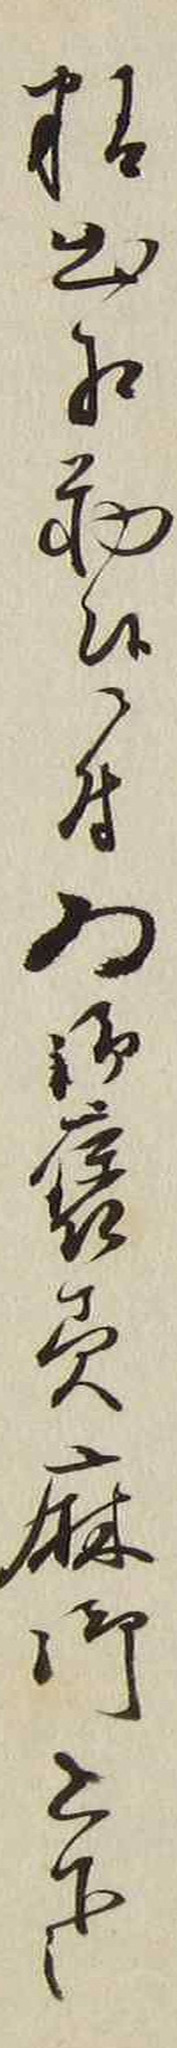精出相勤候ニ付為御褒美麻御上下
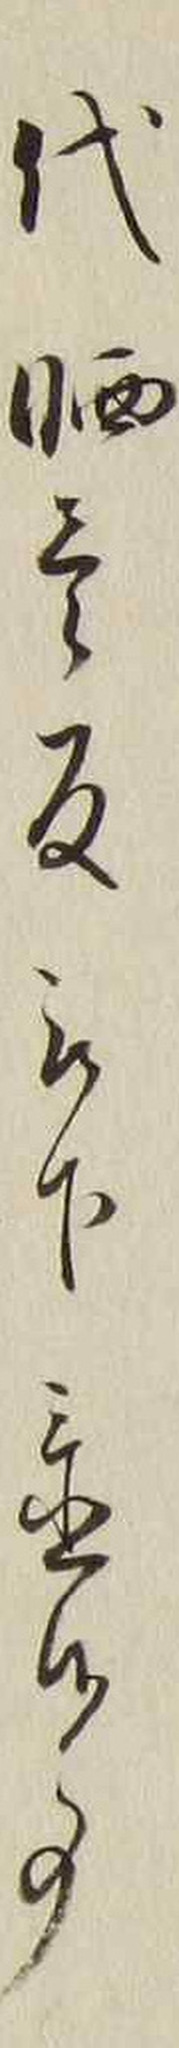代晒壱反被下置候事

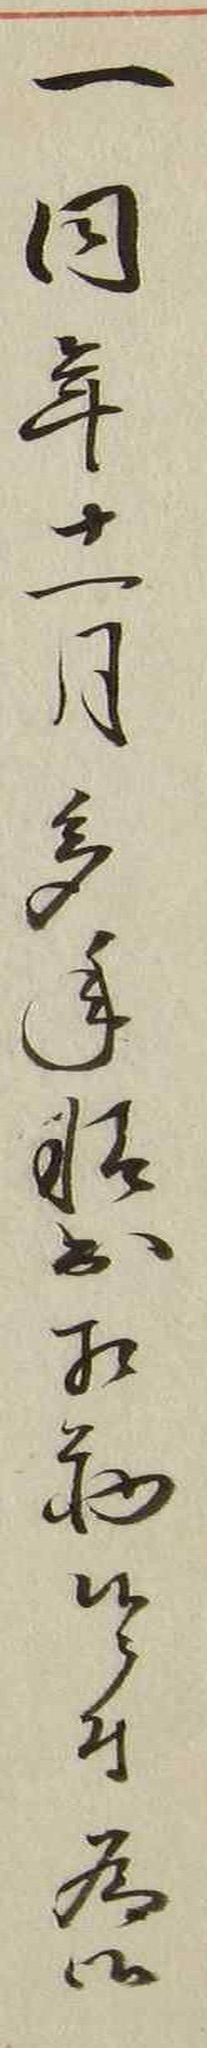一同年十一月多年精出相勤候ニ付為御
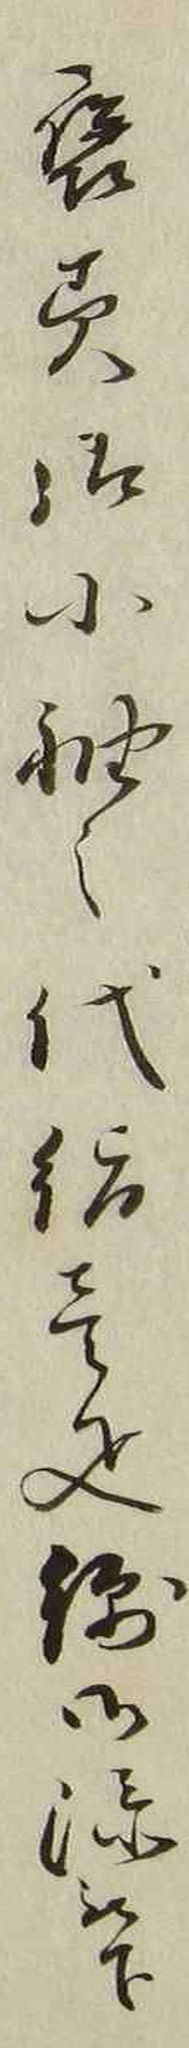褒美御小袖之代絹壱疋綿御添被下
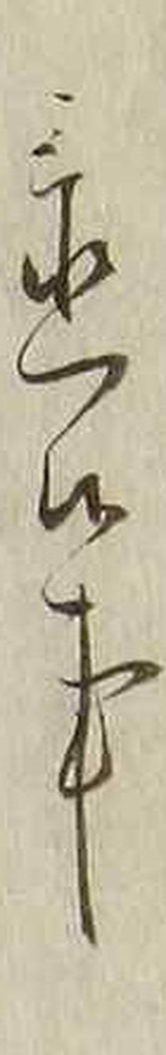置候事
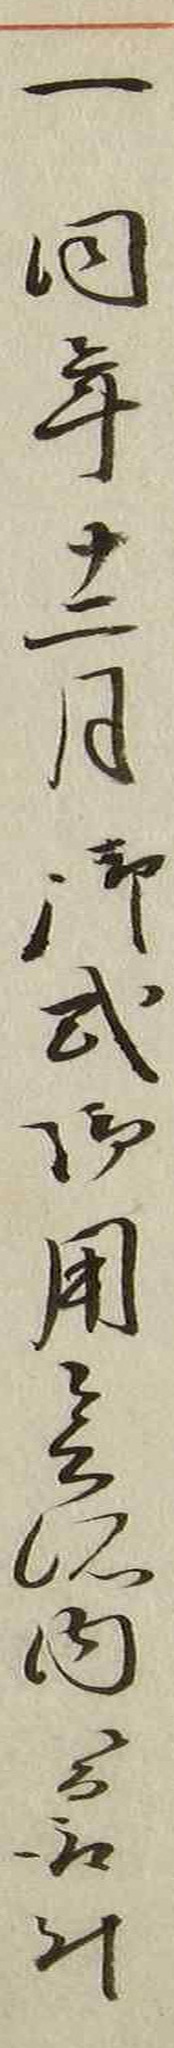一同年十二月御式御用会所内ニ而取計
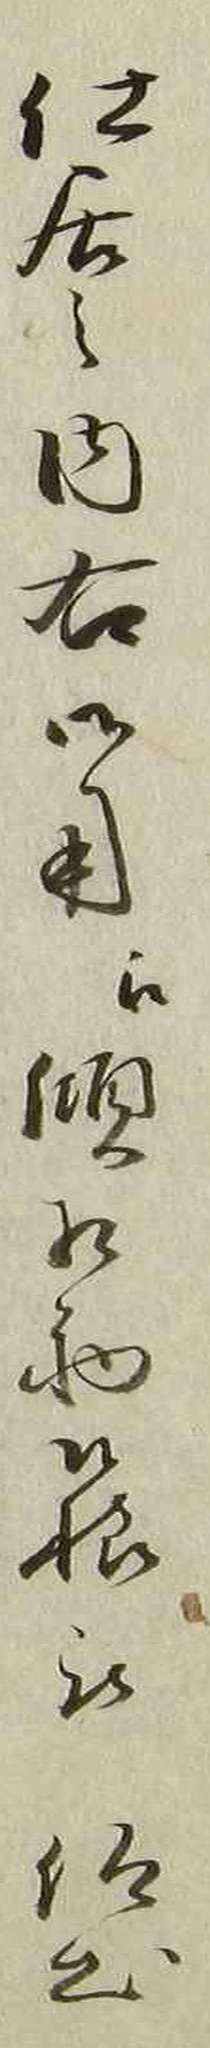仕居之内右御用江傾相勤候様被仰出
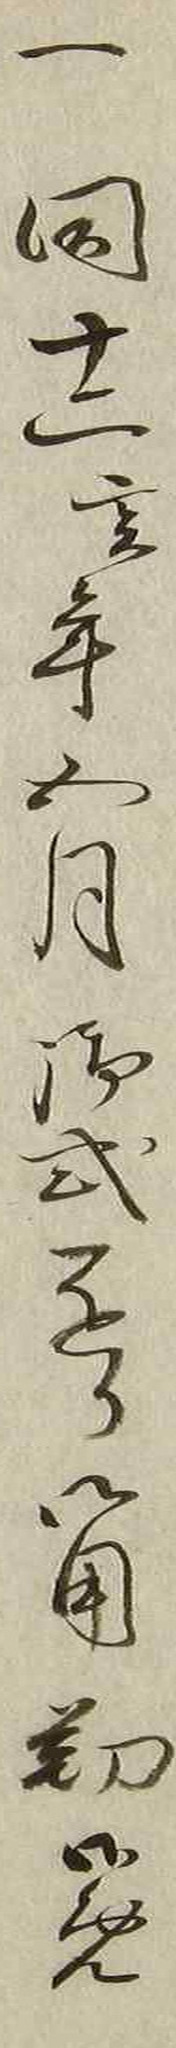一同十二亥年五月御式懸り御用勤御免
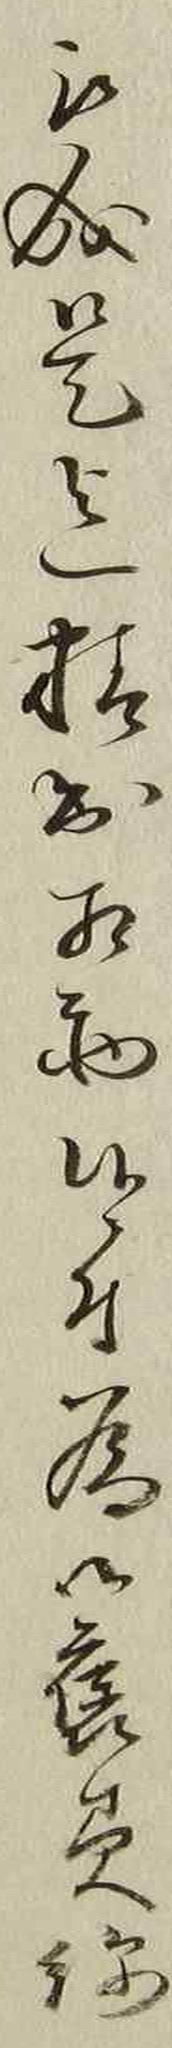被成是迄精出相勤候ニ付為御褒美綿
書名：諸士系譜　巻之25　い之部25
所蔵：会津若松市立会津図書館
